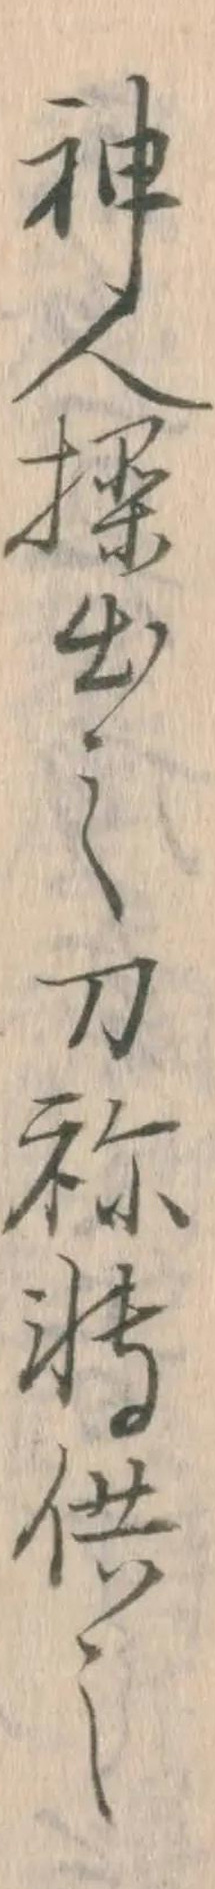神人操出之刀祢転供之

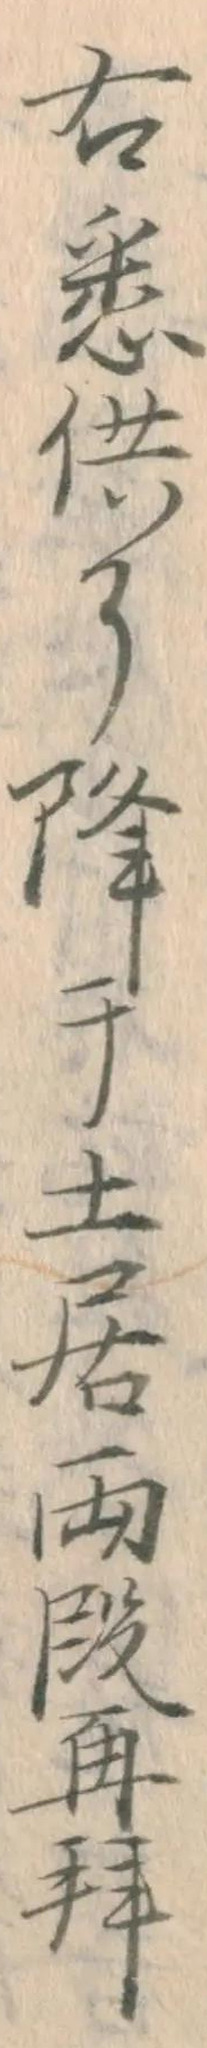右悉供了降于土居両段再拝
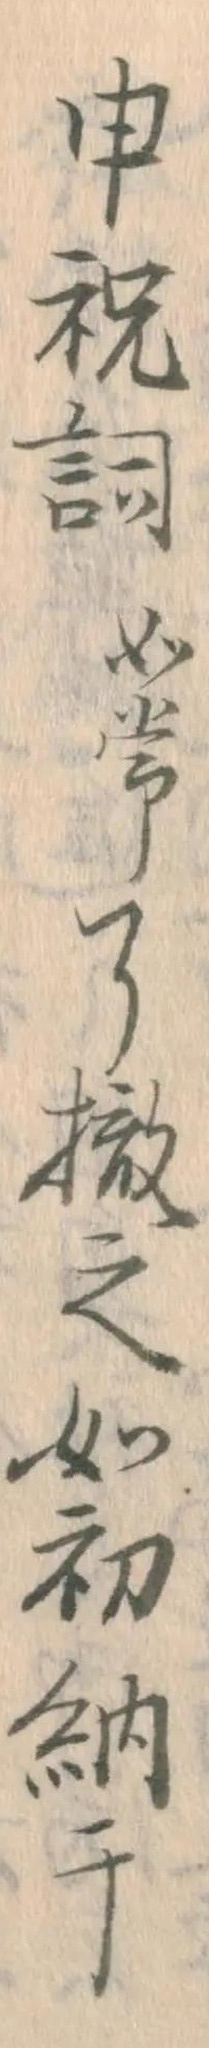申祝詞如常了撒之如初納于
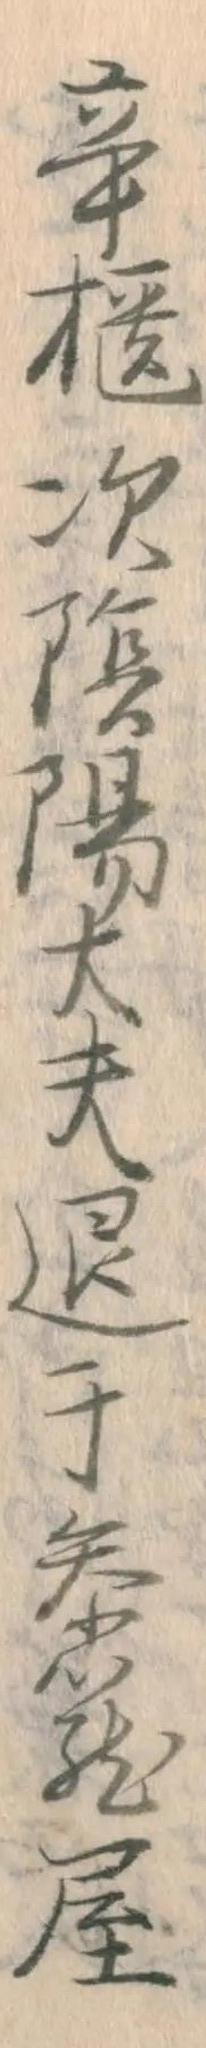辛櫃次陰陽大夫退于参籠屋
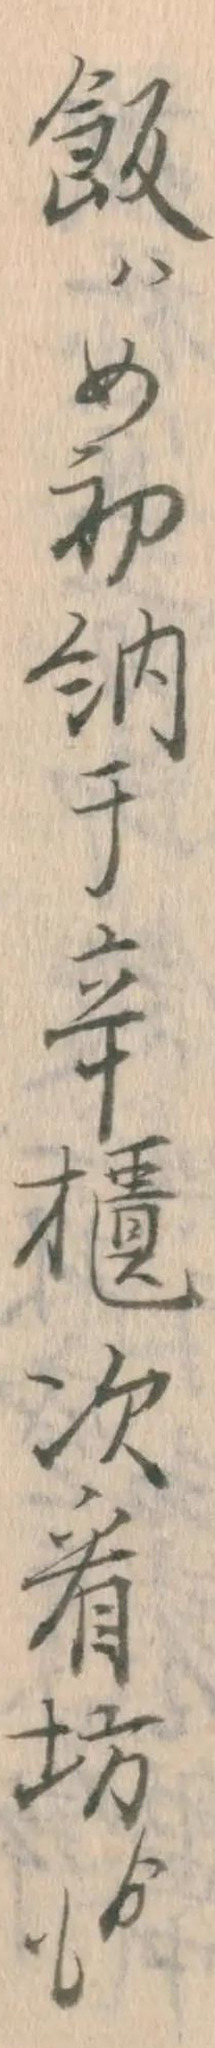飯は如初納于辛櫃次看坊ゟも
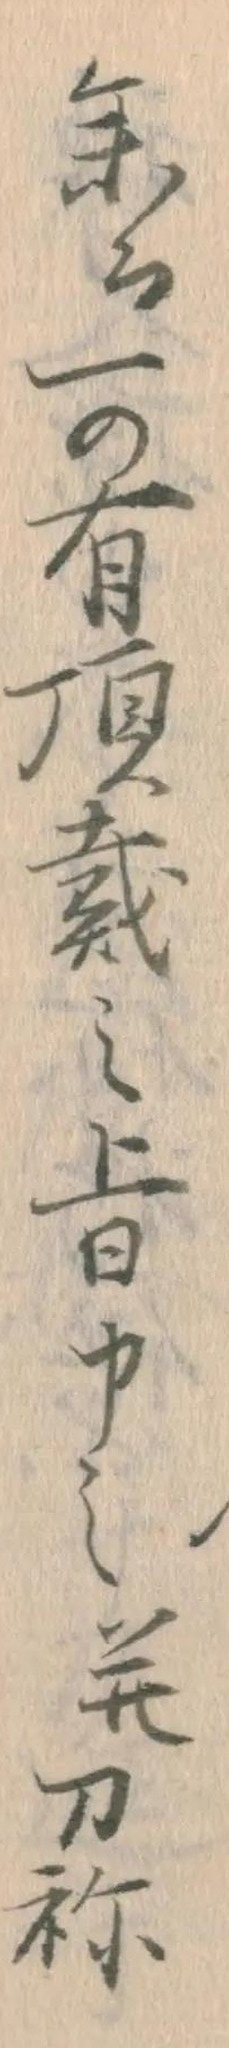参而可有頂戴之旨申之并刀祢
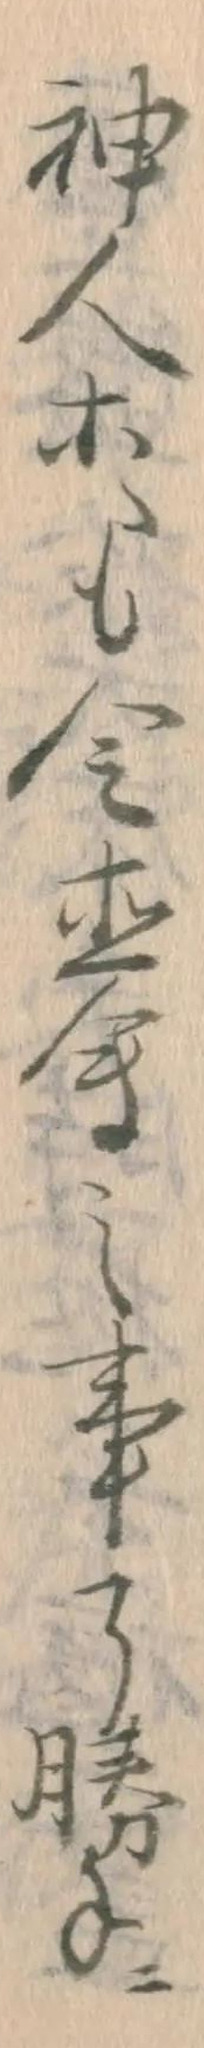神人等へも令直会之事了勝手に
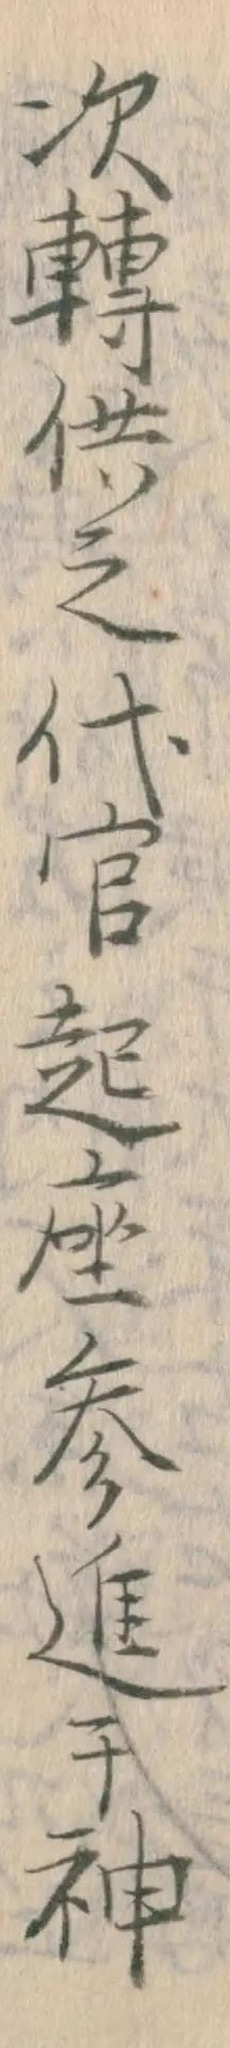次転供之代官起座参進于神
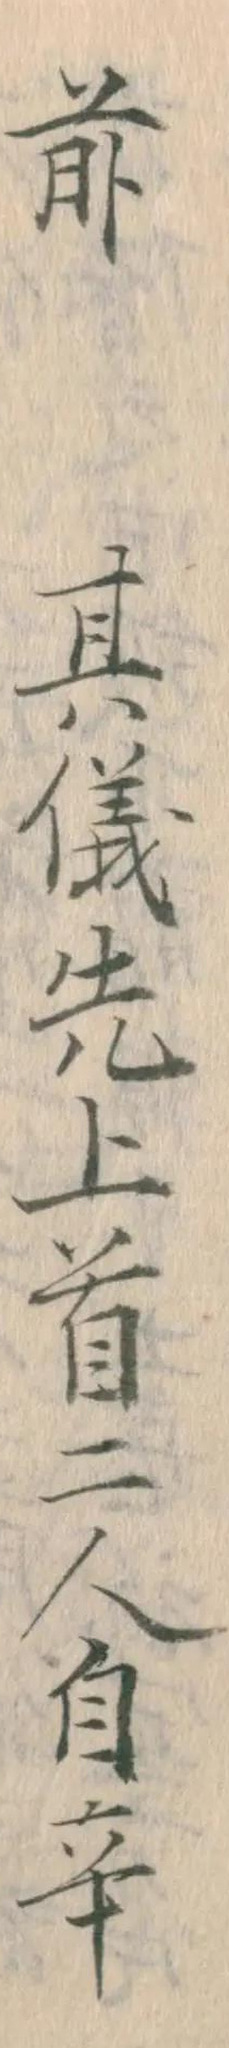前其儀先上首二人自辛
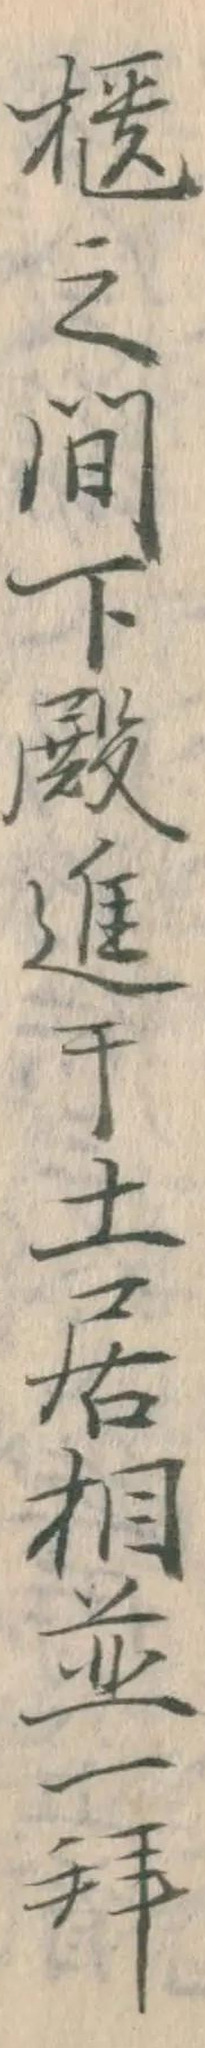櫃之間下殿進于土居相並一拝
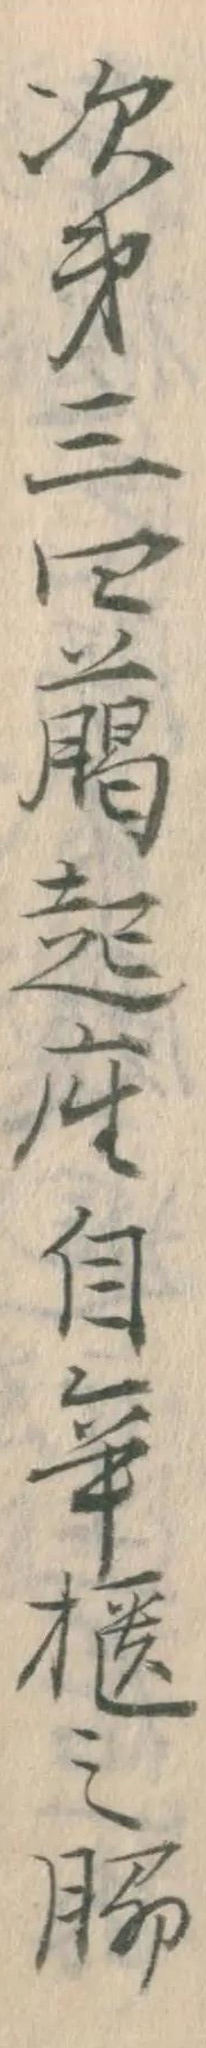次第三四臈起座自辛櫃之脇
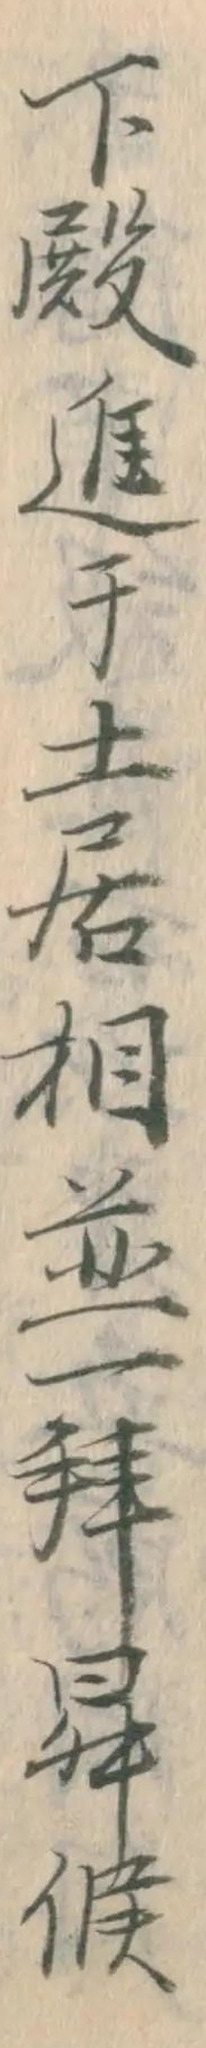下殿進于土居相並一拝昇候

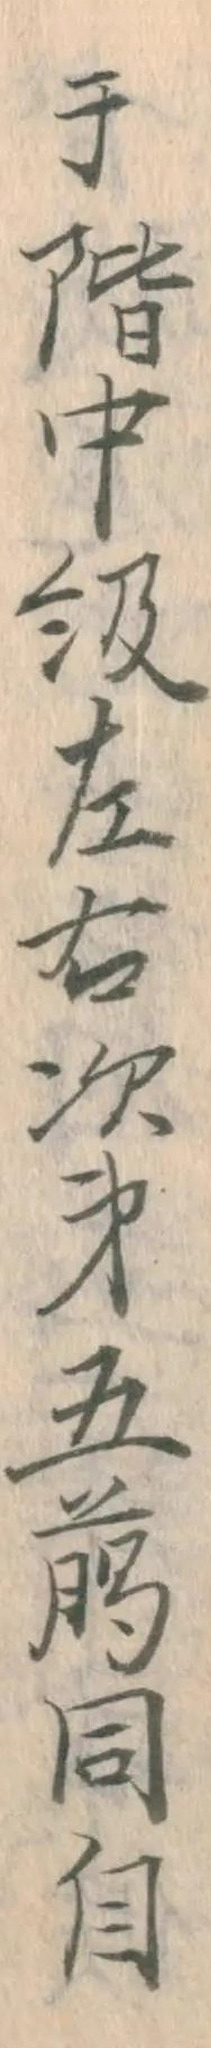于階中級左右次第五臈同自
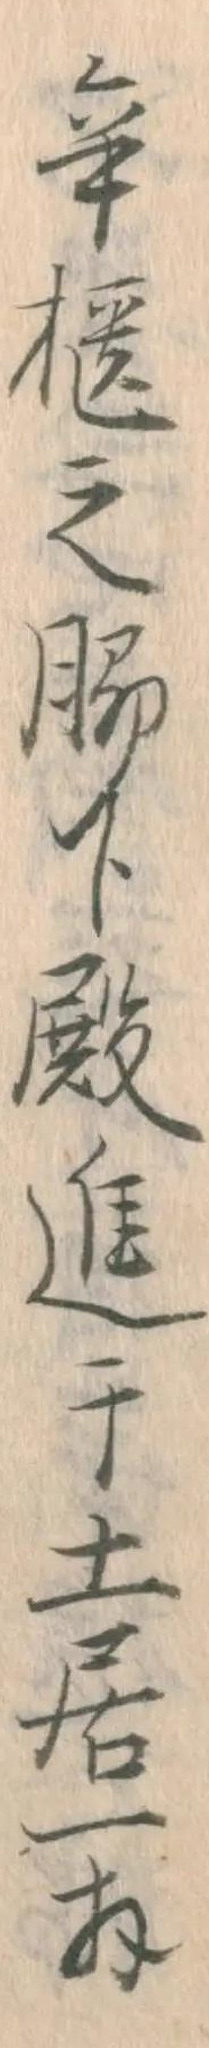辛櫃之脇下殿進于土居一拝
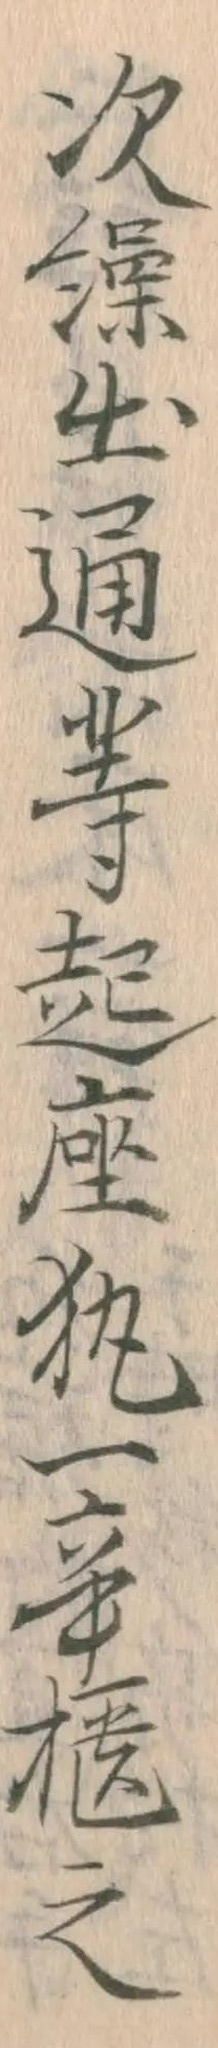次繰出通等起座執一辛櫃之
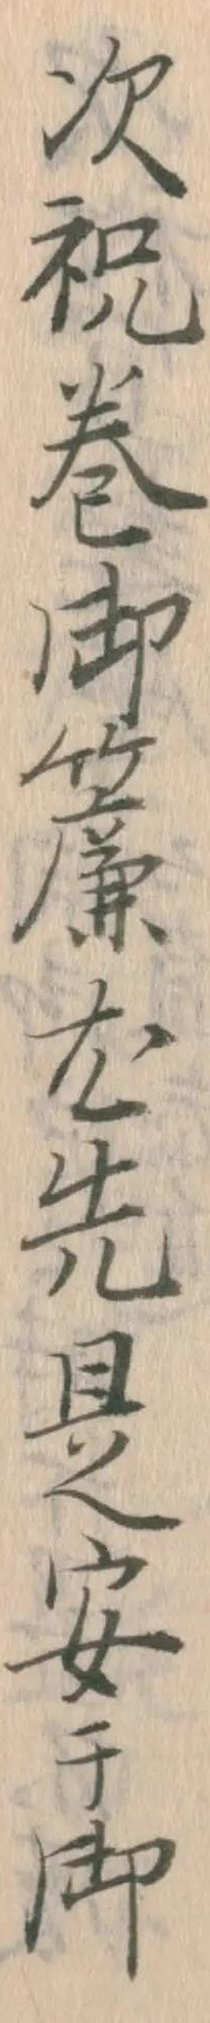次祝巻御簾尤先是安于御
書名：賀茂社記録. 第81冊
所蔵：国立国会図書館 National Diet Library, JAPAN
